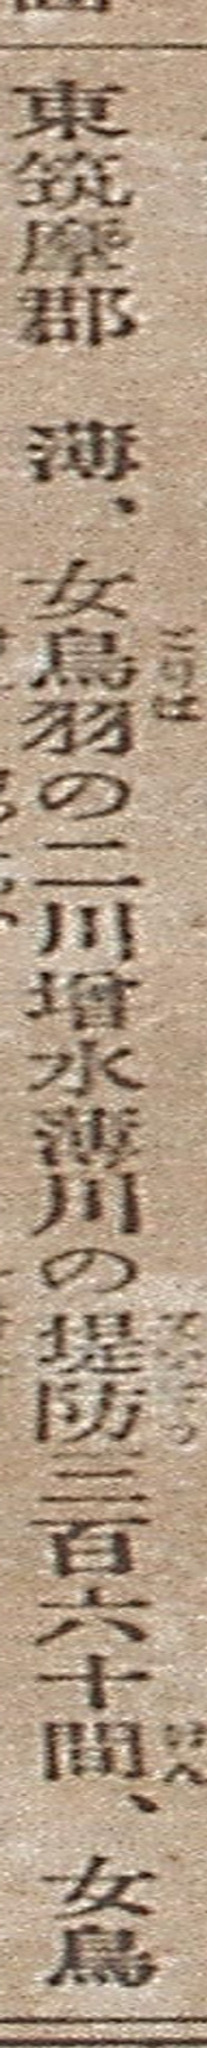東筑摩郡薄、女鳥羽の二川増水薄川の堤防三百六十間、女鳥
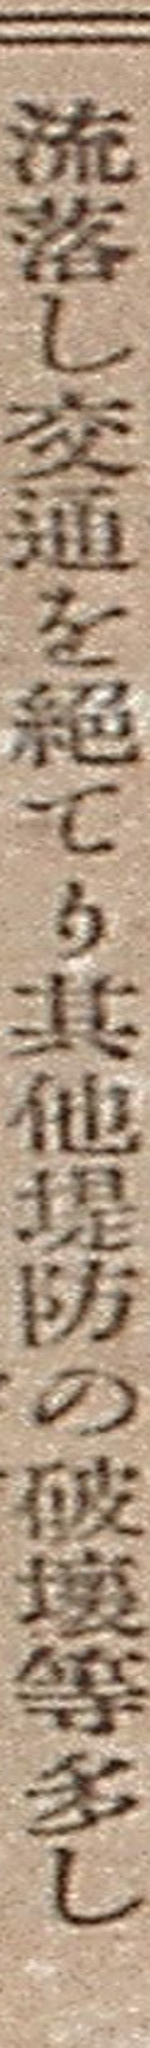流落し交通を絶てり其他堤防の破壊等多し
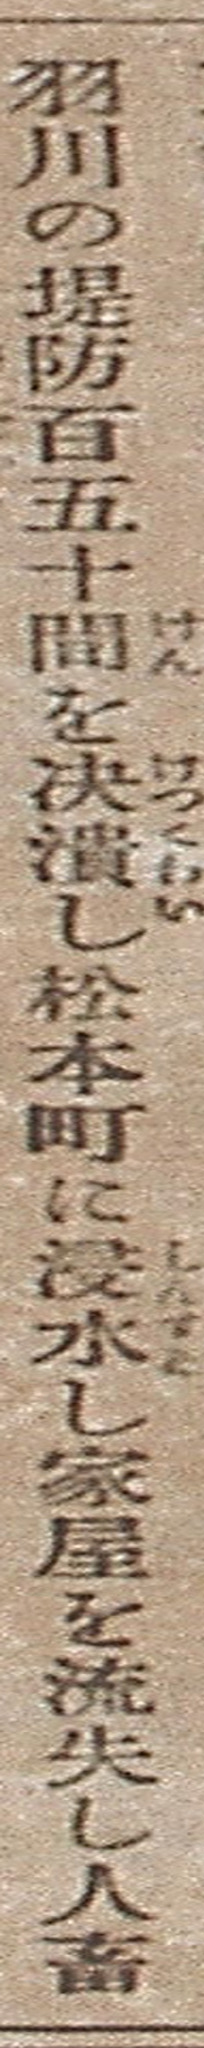羽川の堤防百五十間を决潰し松本町に浸水し家屋を流失し人畜
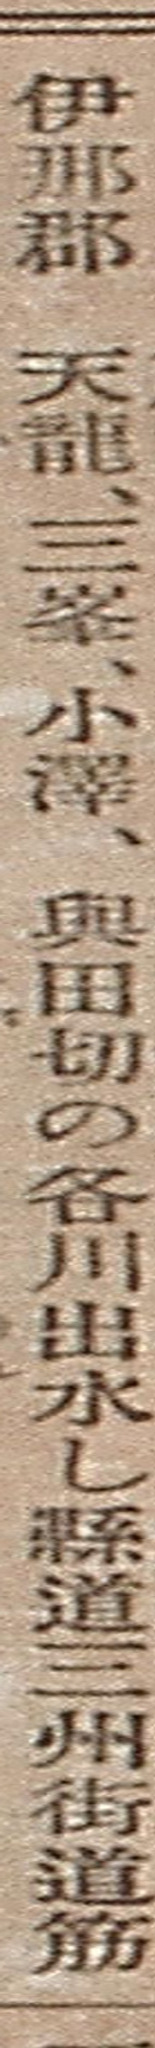伊那郡天竜、三峯、小沢、与田切の各川出水し県道三州街道筋
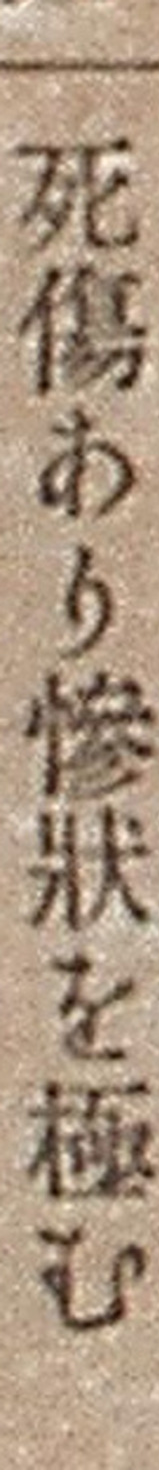死傷あり惨状を極む
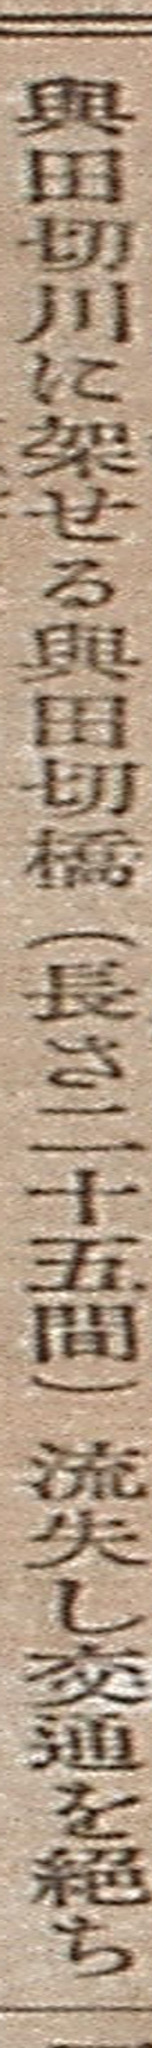与田切川に架せる与田切橋さ二十五間）流失し交通を絶ち
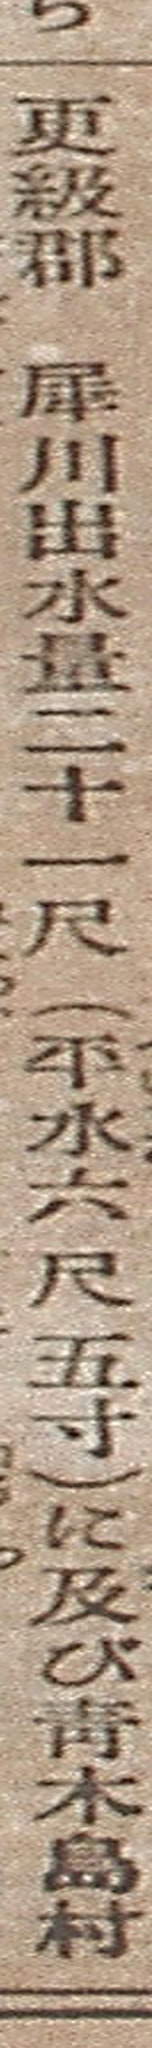更級郡犀川出水量二十一尺六尺五寸）に及び青木島村
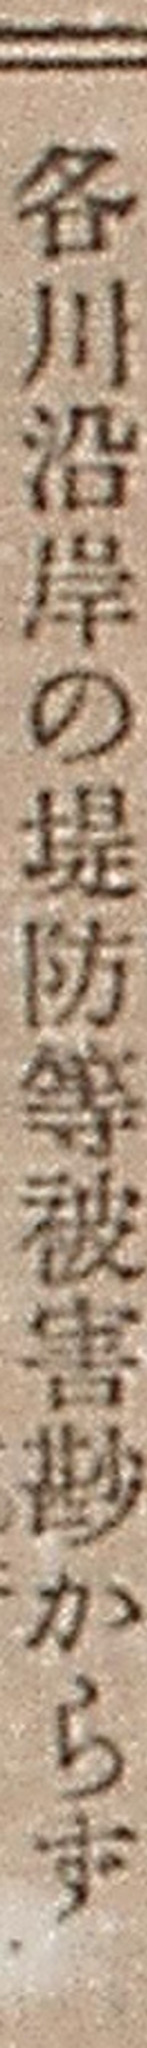各川沿岸の堤防等被害尠からず
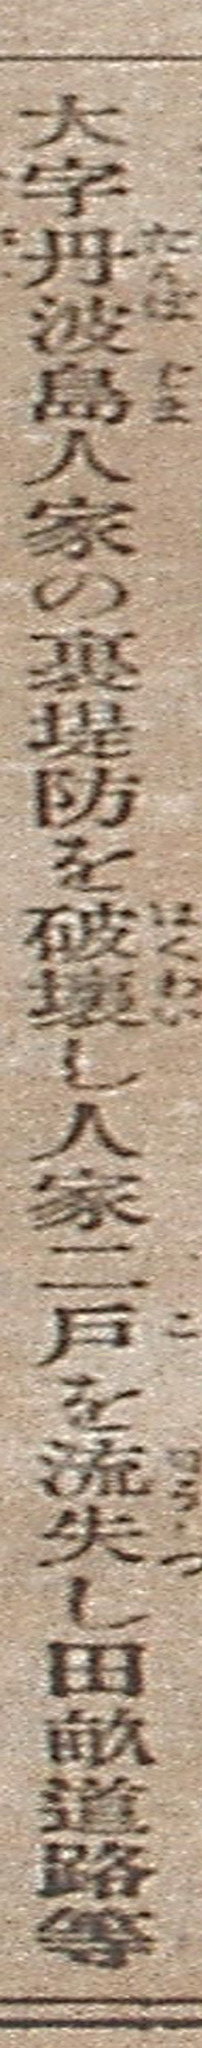大字丹波島人家の裏堤防を破壊し人家二戸を流失し田畝道路等
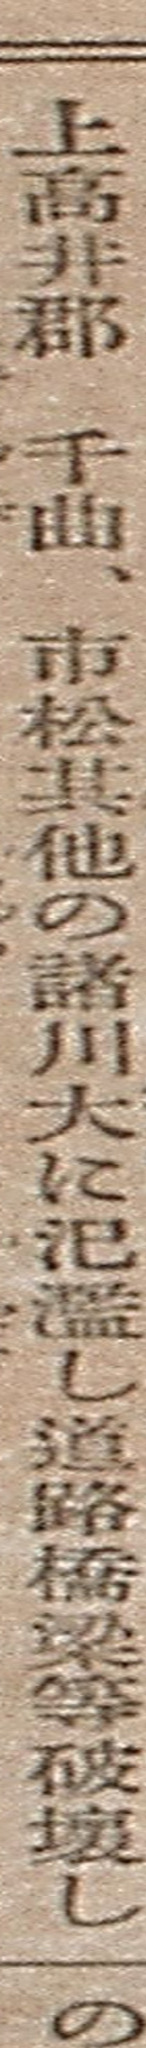上高井郡千曲、市松其他の諸川大に氾濫し道路橋橋梁等破壊し
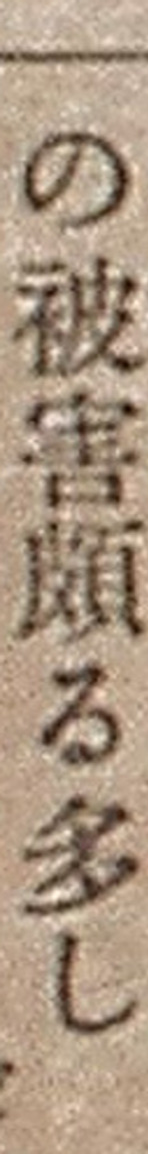の被害頗る多し
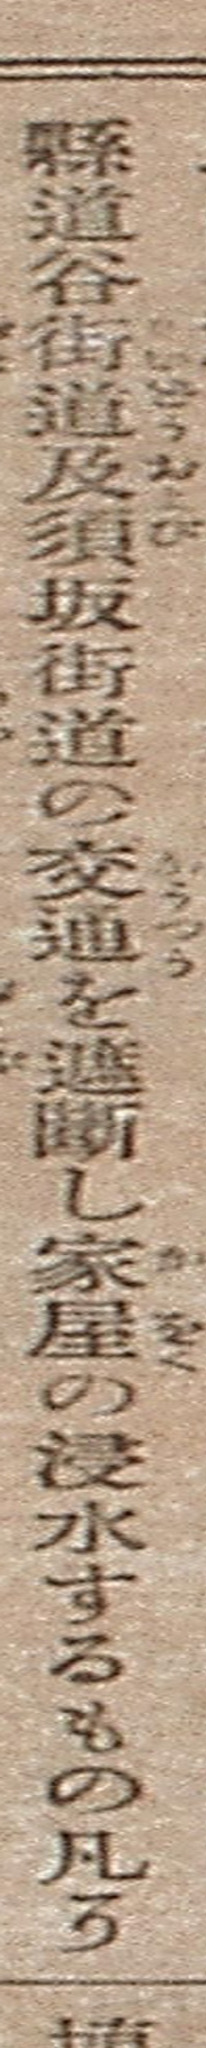県道谷街道及須坂街道の交通を遮断し家屋の浸水するもの凡そ
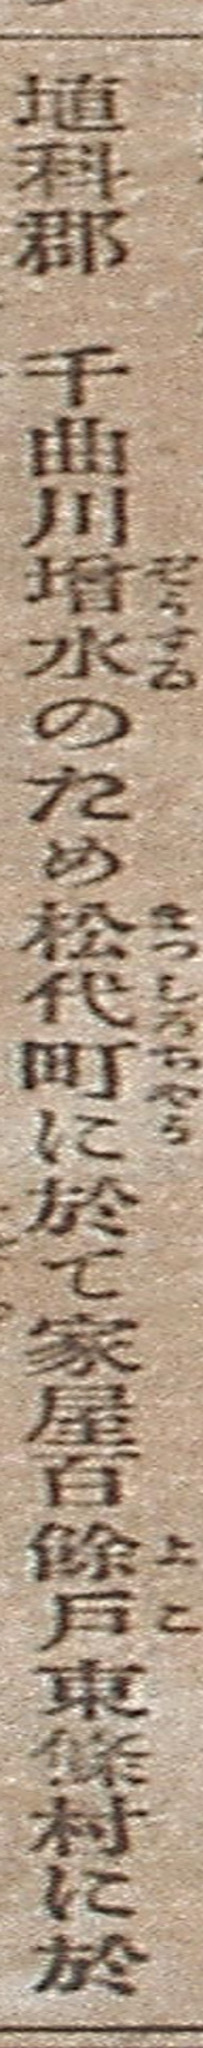埴科郡千曲川増水のため松代町に於て家屋百餘戸東條村に於
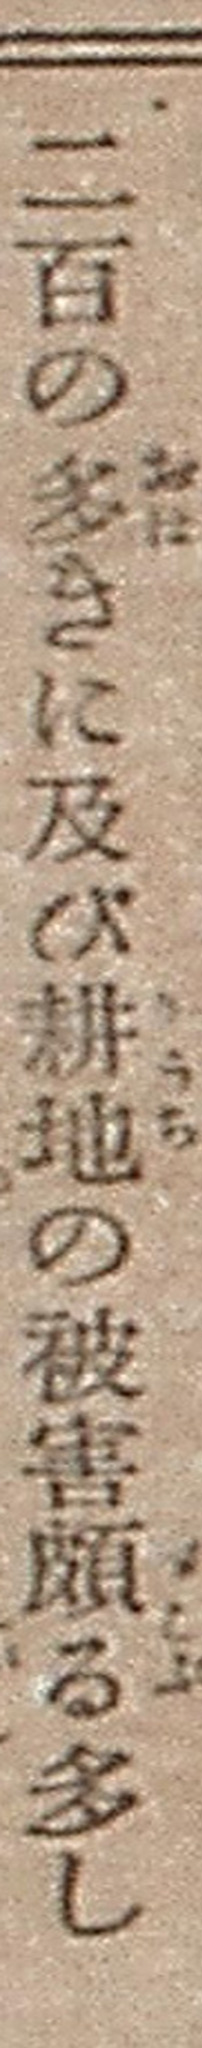二百の多きに及び耕地の被害頗る多し
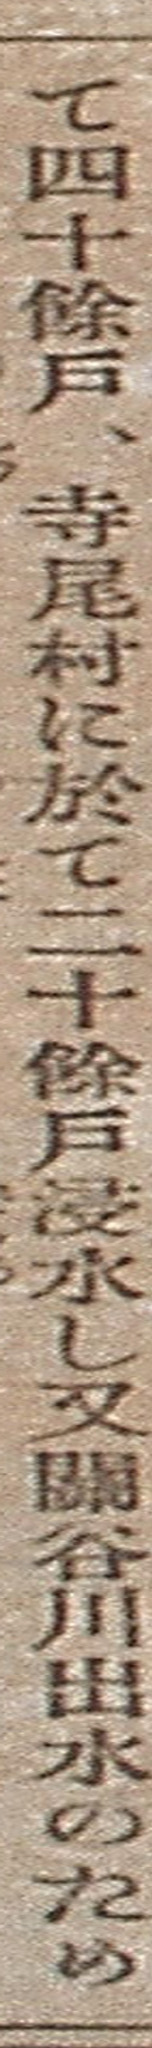て四十餘戸、寺尾村に於て二十餘戸浸水し又関屋川出水のため
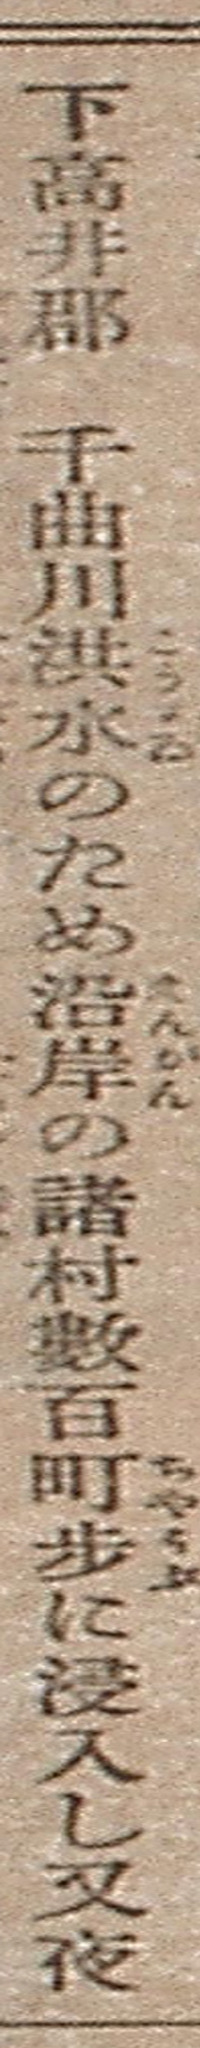下高井郡千曲川洪水のため沿岸の諸村数百町歩に浸水し又夜
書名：風俗畫報臨時増刊第百二十六號　洪水被害録（中）
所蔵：東京大学地震研究所図書室 Earthquake Research Institute Library, The University of Tokyo, JAPAN
